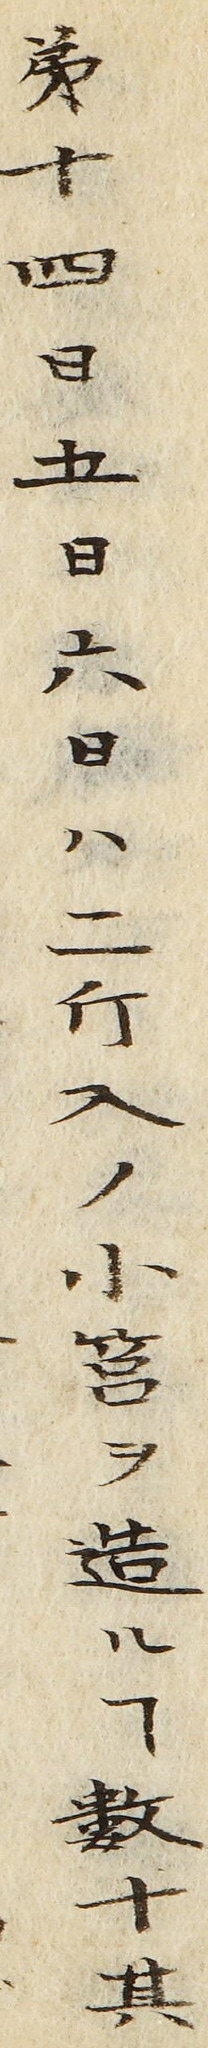第十四日五日六日ハ二斤入ノ小筥ヲ造ルコト数十其
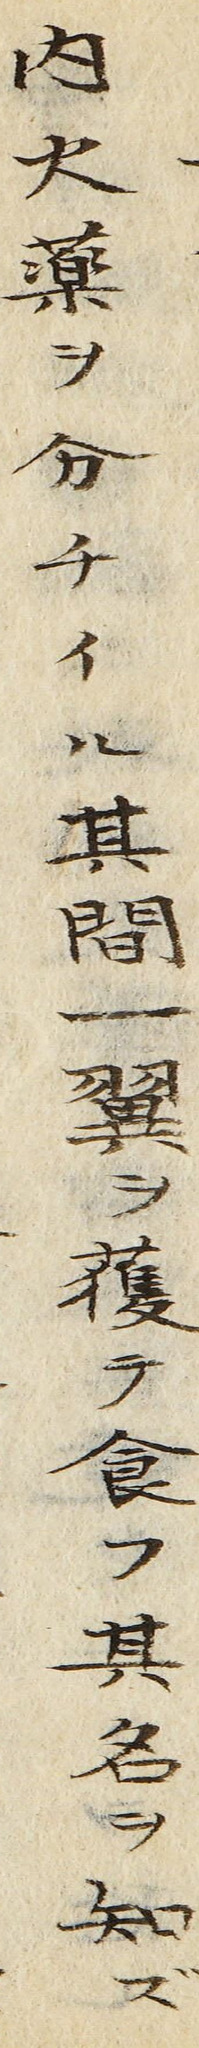内火薬ヲ分チイル其間一翼ヲ獲テ食フ其名ヲ知ズ
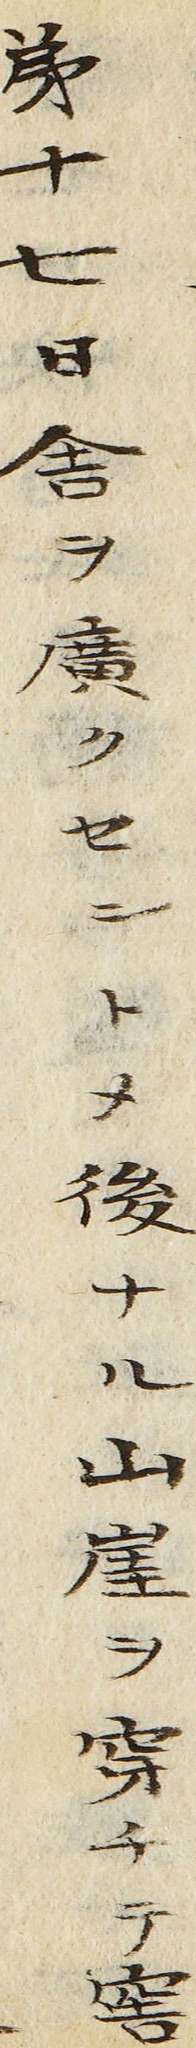第十七日舎ヲ広クセントシテ後ナル山崖ヲ穿チテ窖
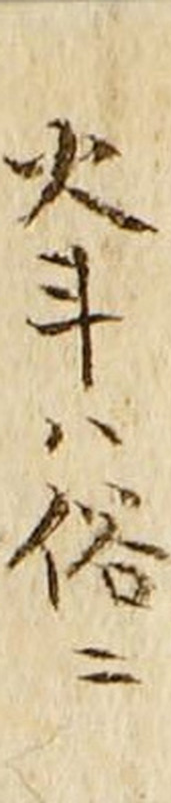火斗ハ俗ニ
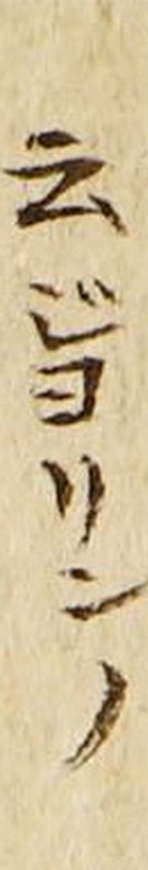云ジヨリンノ
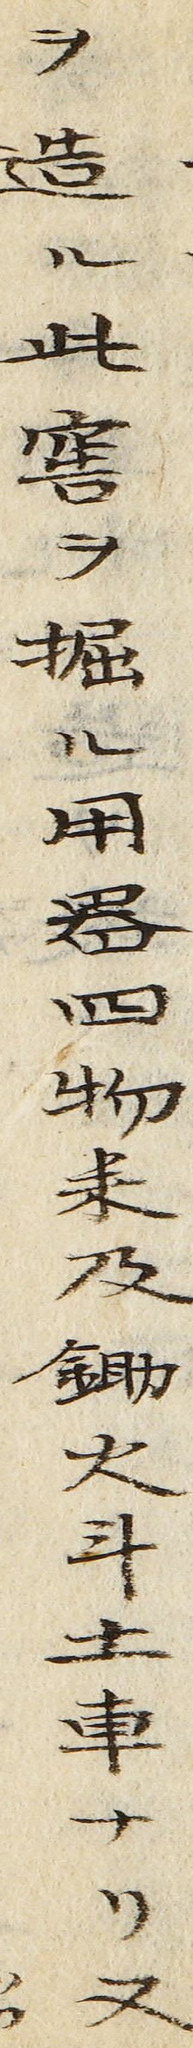ヲ造ル此窖ヲ掘ル用器四物耒及鋤火斗土車ナリ又
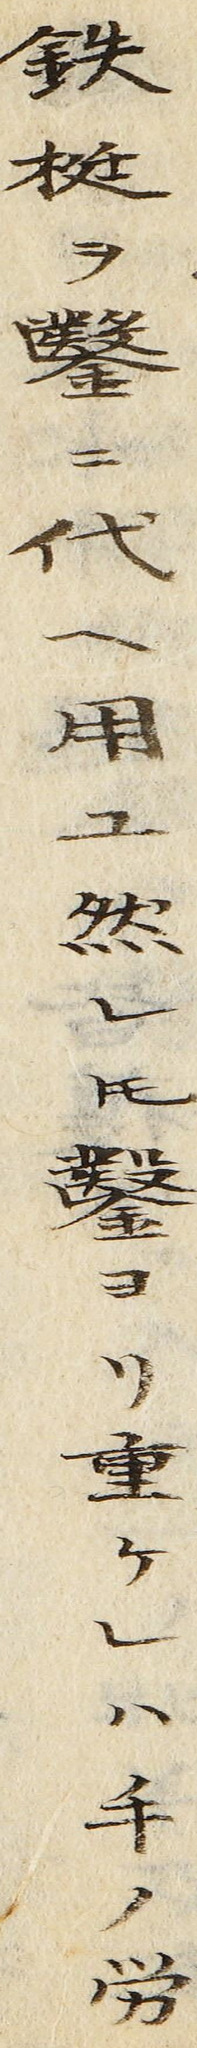鉄梃ヲ鑿ニ代ヘ用ユ然レトモ鑿ヨリ重ケレハ手ノ労
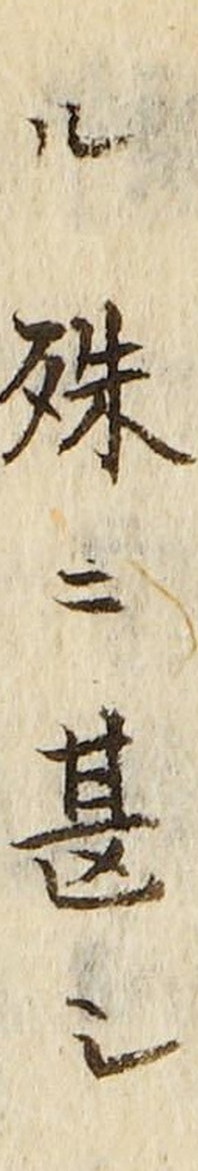レ殊ニ甚シ
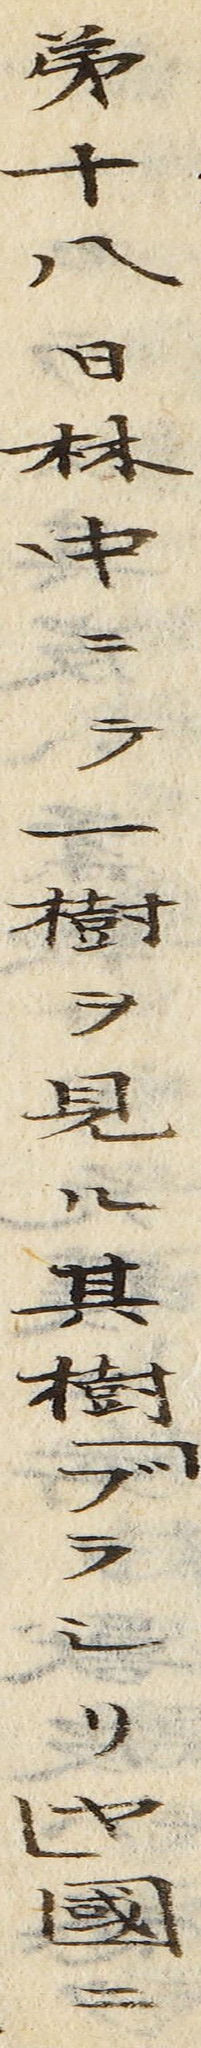第十八日林中ニテ一樹ヲ見ル其樹「ブラシリヤ」国ニ
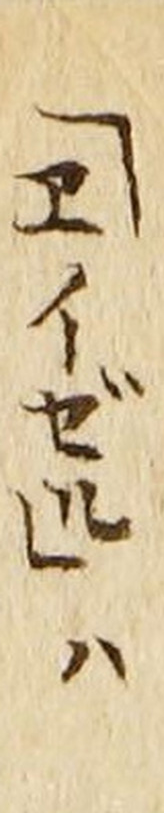「ヱイゼル」ハ
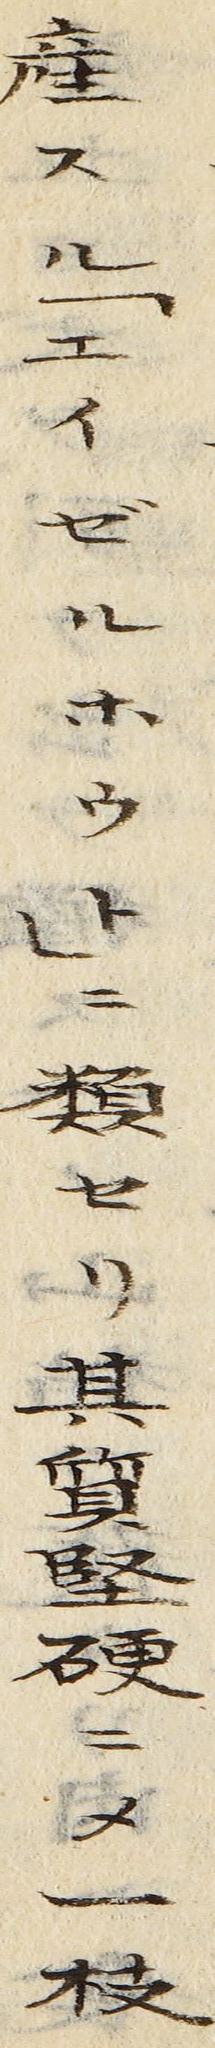産スル「エイゼルホウト」ニ類セリ其質堅硬ニシテ一枝
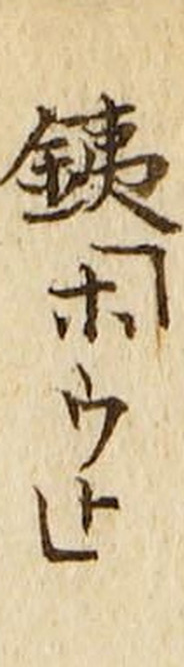鉄「ホウト」
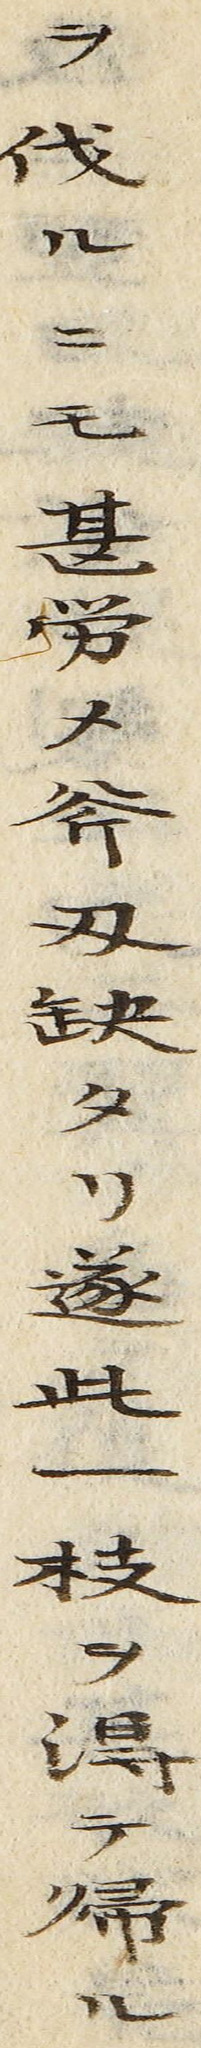ヲ伐ルニモ甚労シテ斧刃欠タリ遂此一枝ヲ得テ帰ル
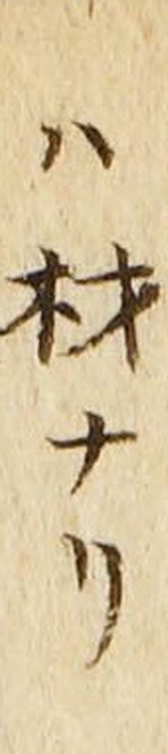ハ材ナリ
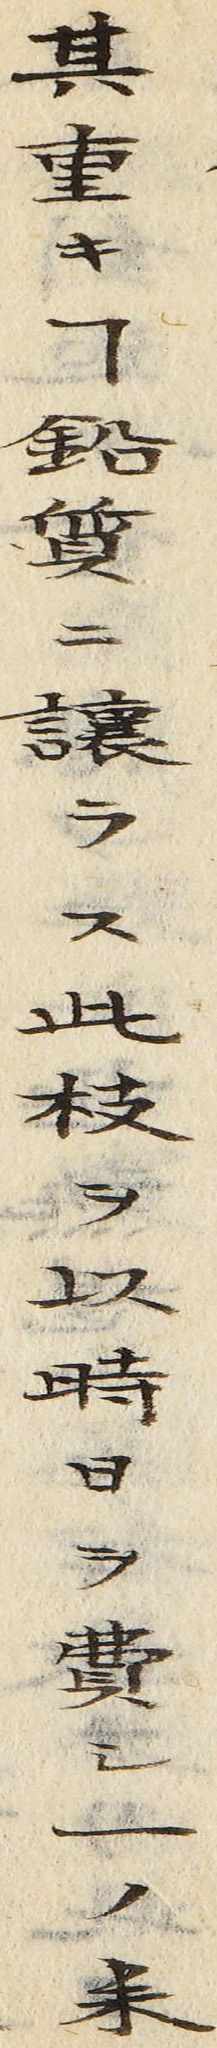其重キコト鉛質ニ譲ラス此枝ヲ以時日ヲ費シ一ノ耒
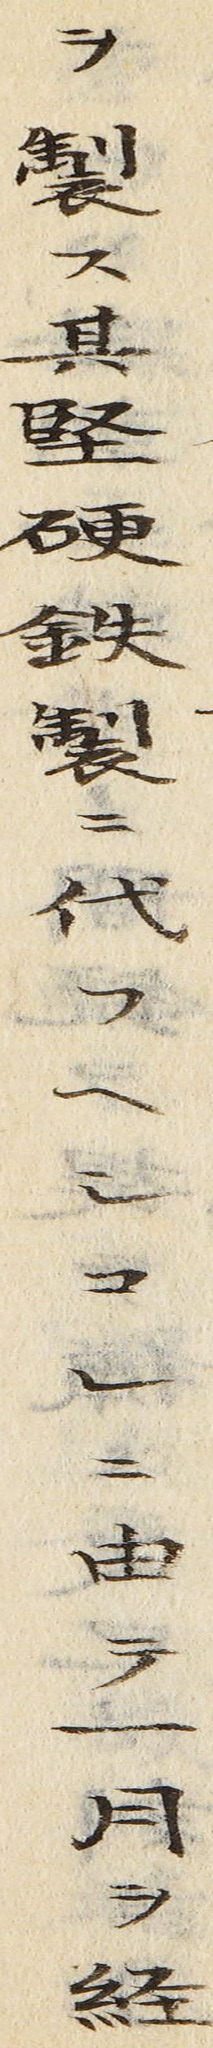ヲ製ス其堅硬鉄製ニ代フヘシコレニ由テ一月ヲ経
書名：漂流紀事
